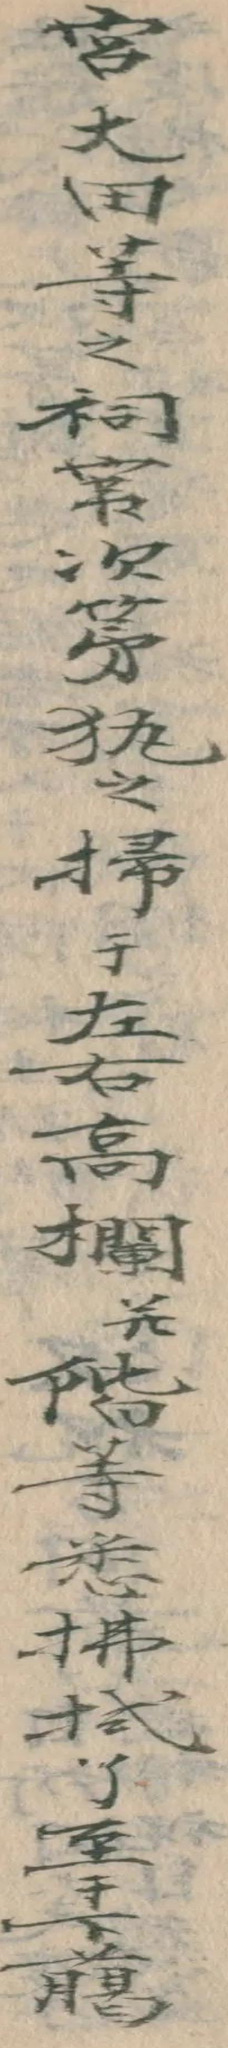宮大田等之祠官次第執之掃于左右高欄并階等悉払拭了至于下臈
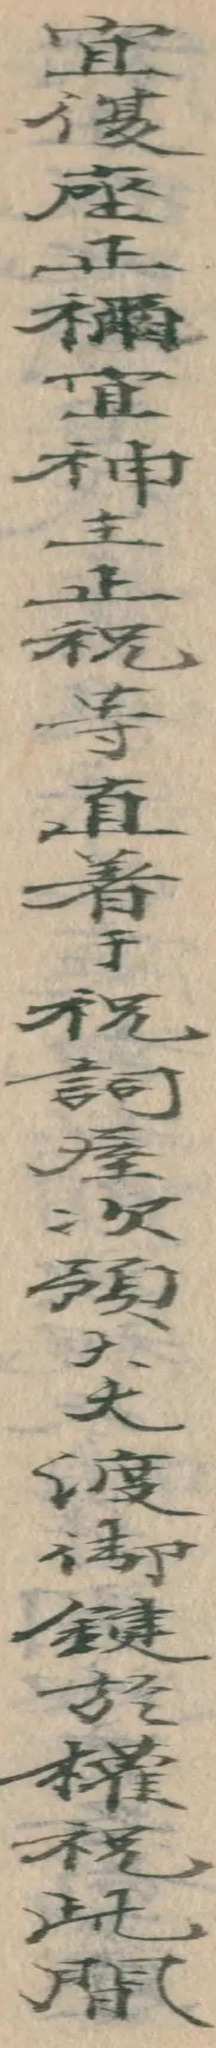宜復座正祢宜神主正祝等直着于祝詞屋次預大夫渡御鍵於権祝此間
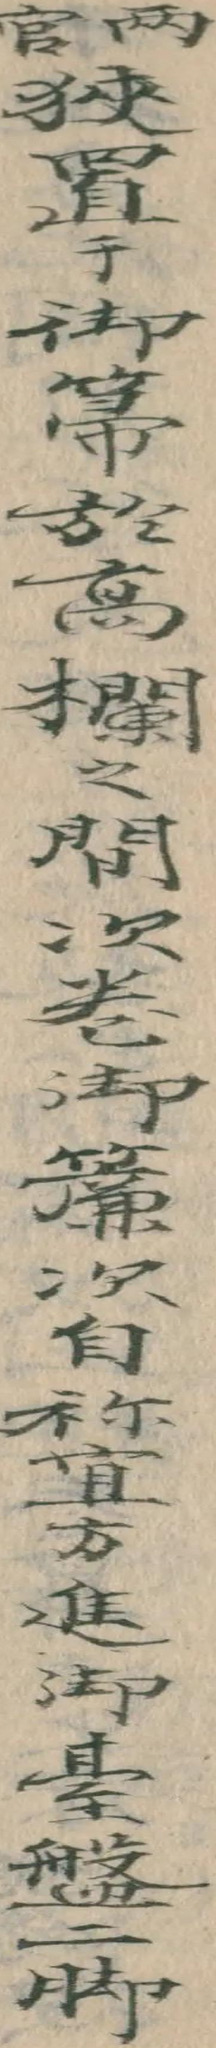両官狭置于御箒於高欄之間次巻御簾次自祢宜方進御台盤二脚
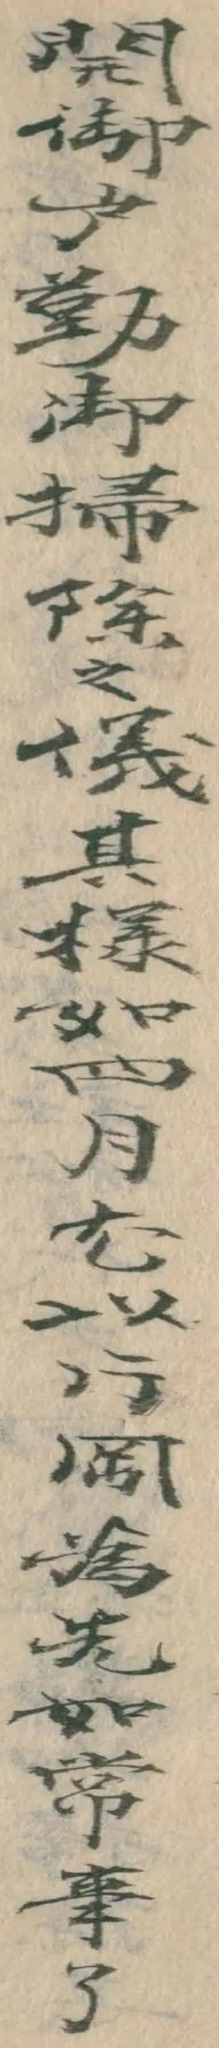開御戸勤御掃除之儀其様如四月尤以片岡為先如常事了

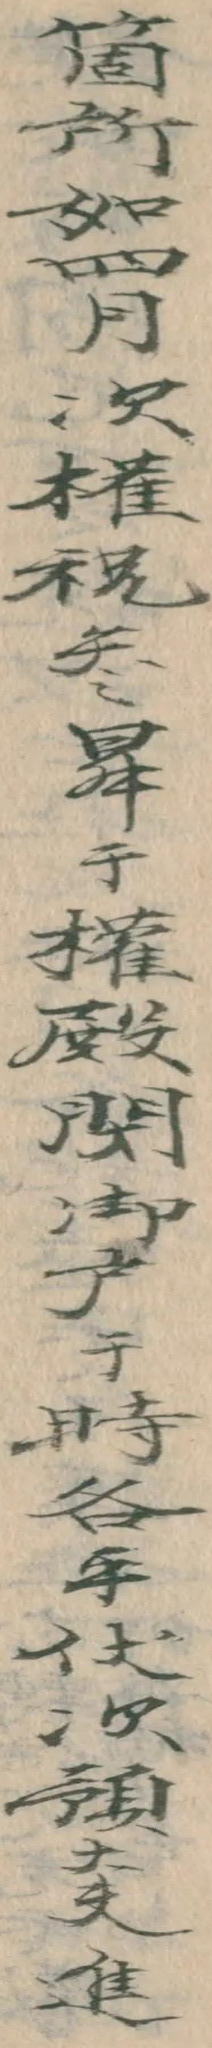箇所如四月次権祝参昇于権殿閉御戸于時各平伏次預大夫進
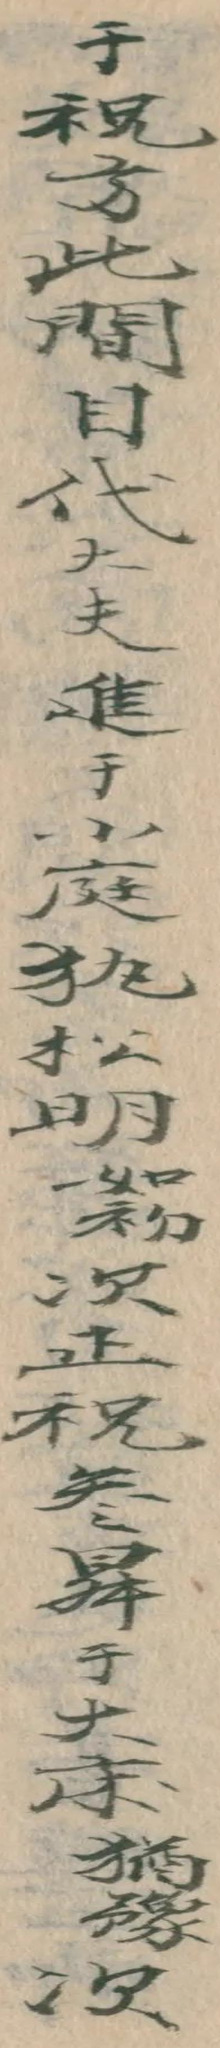于祝方此間目代大夫進于小庭執松明如初次正祝参昇于大床猶予次
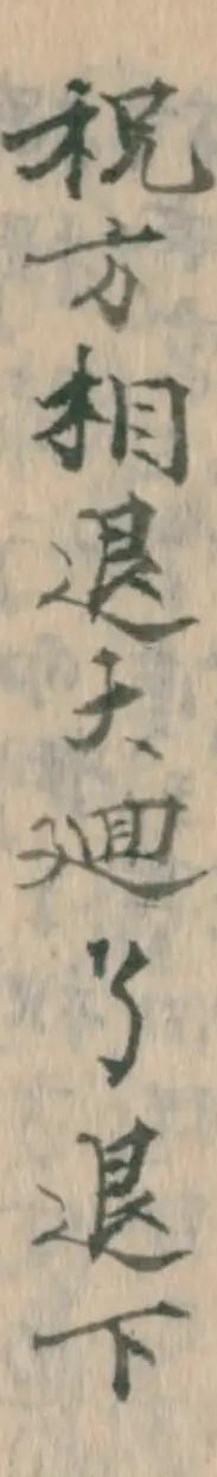祝方相退大廻了退下
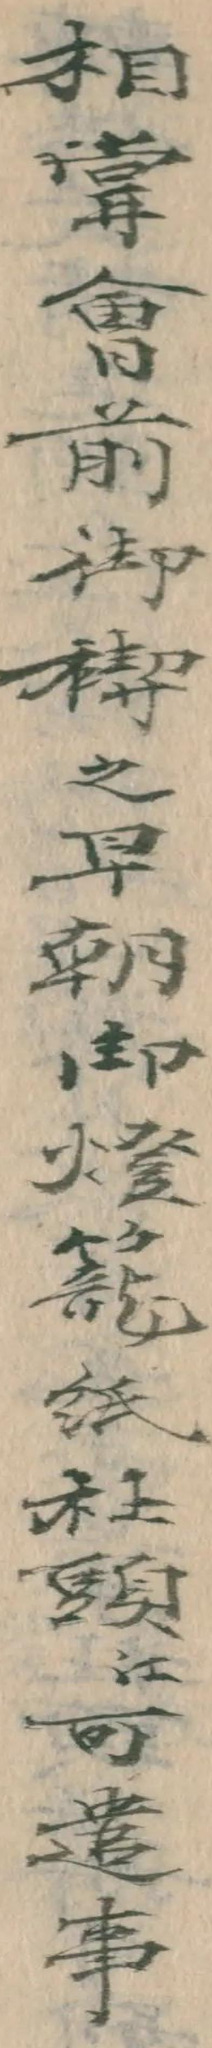相甞会前御禊之早朝御燈籠紙社頭江可遣事
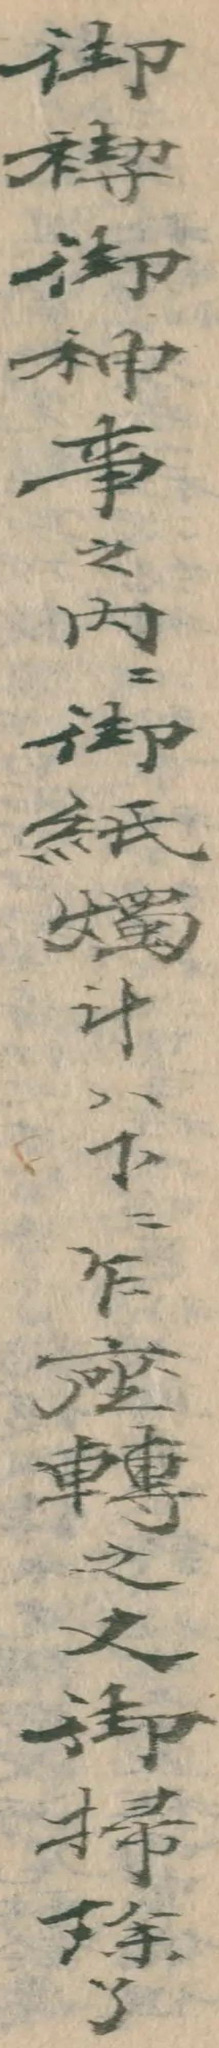御禊御神事之内ニ御紙燭計ハ下ニ乍座転之又御掃除了
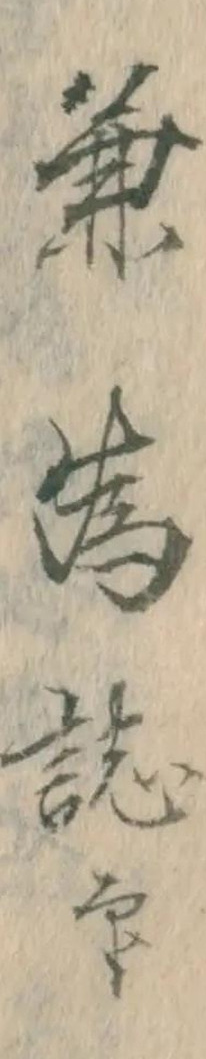兼為誌印

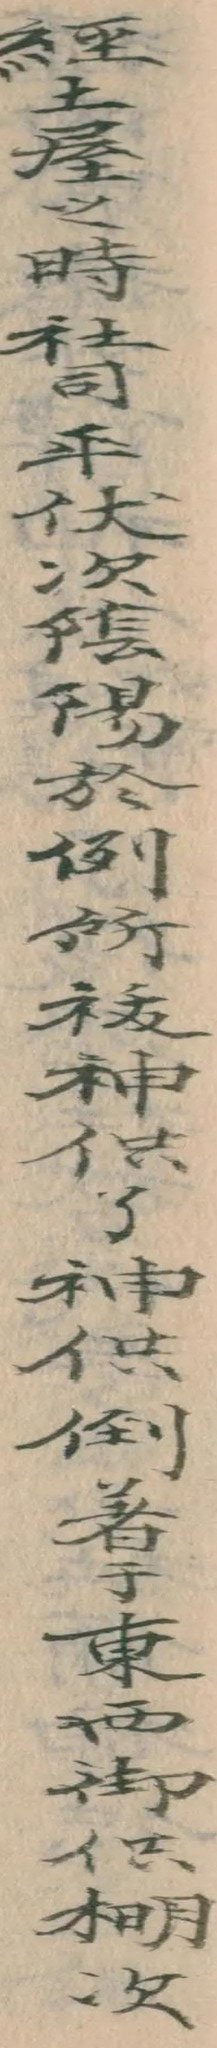経土屋之時社司平伏次陰陽於例所祓神供了神供倒着于東西御供棚次
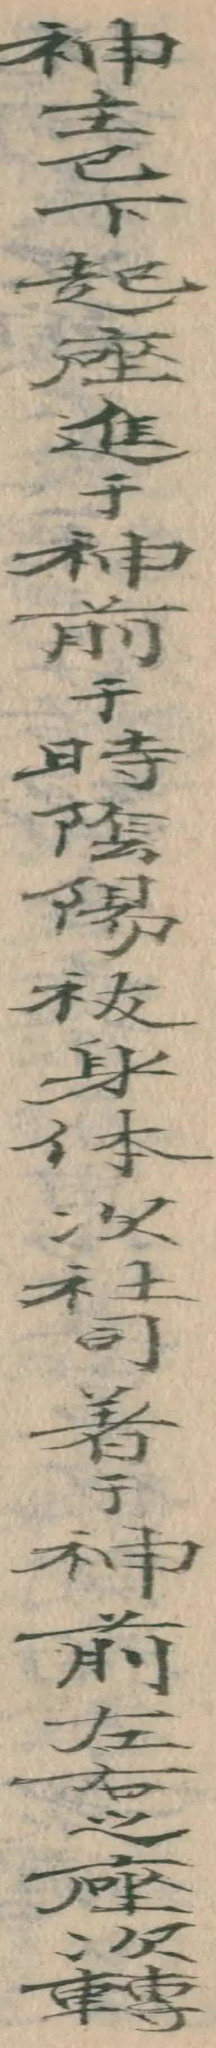神主已下起座進于神前于時陰陽祓身体次社司着于神前左右之座次転

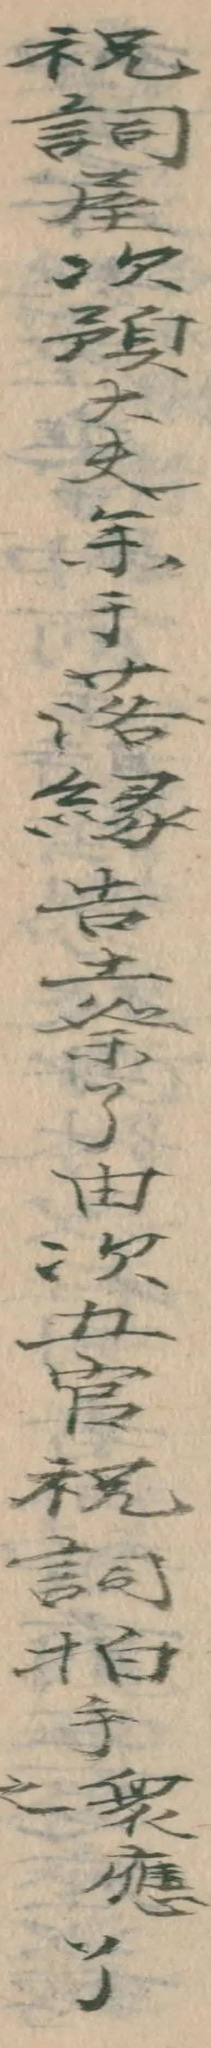祝詞屋次預大夫参于落縁告土祭了由次五官祝詞拍手衆応之了
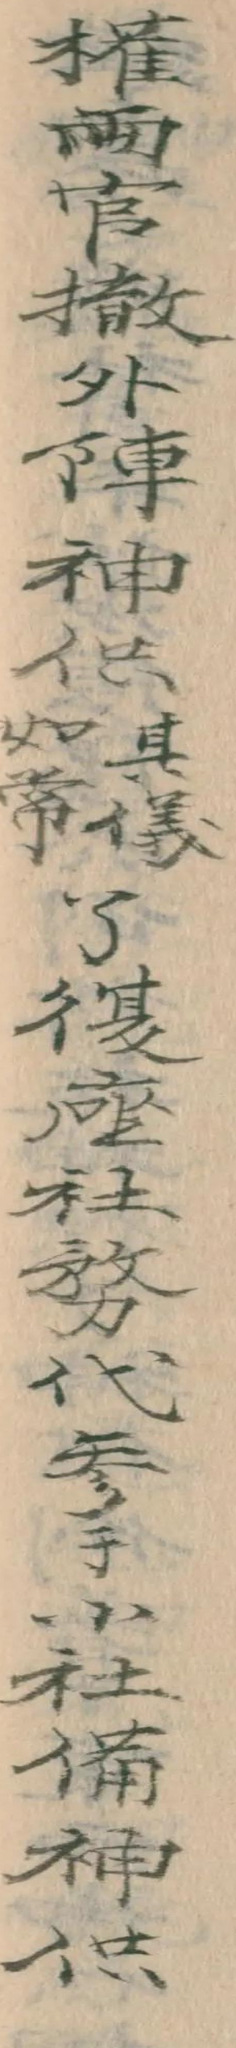権両官撤外陣神供其儀如常了復座社務代参于小社備神供
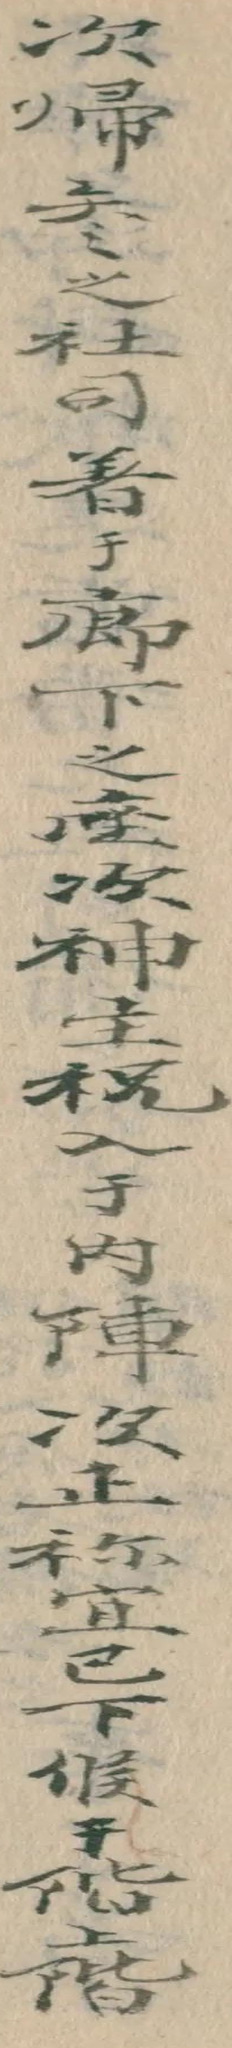次帰参之社司着于廊下之座次神主祝入于内陣次正祢宜已下候于階上階
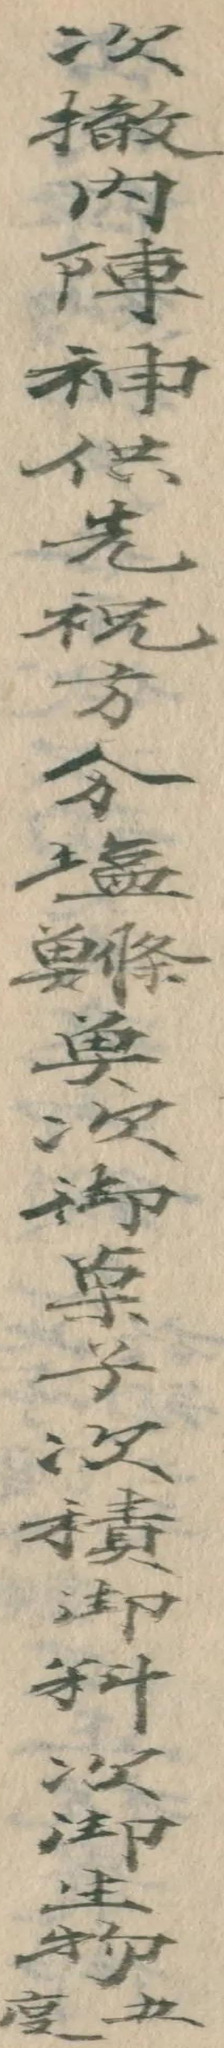次撤内陣神供先祝方分塩鰷魚次御菓子次積御料次御生物五度
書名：賀茂社記録. 第9冊
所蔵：国立国会図書館 National Diet Library, JAPAN
